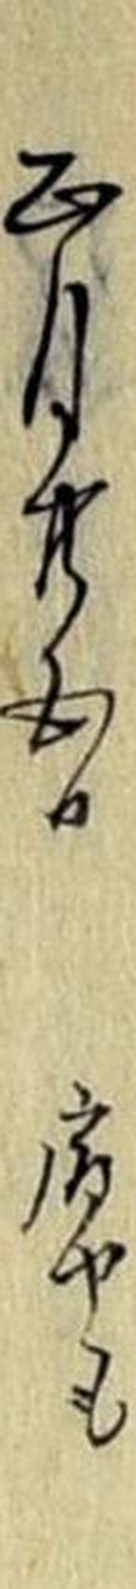正月廿五日府中へも
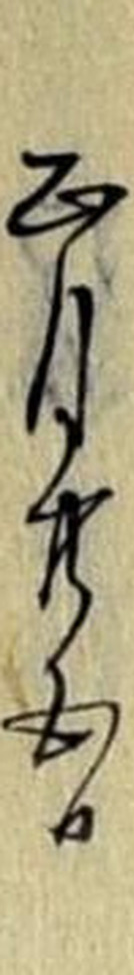正月廿五日
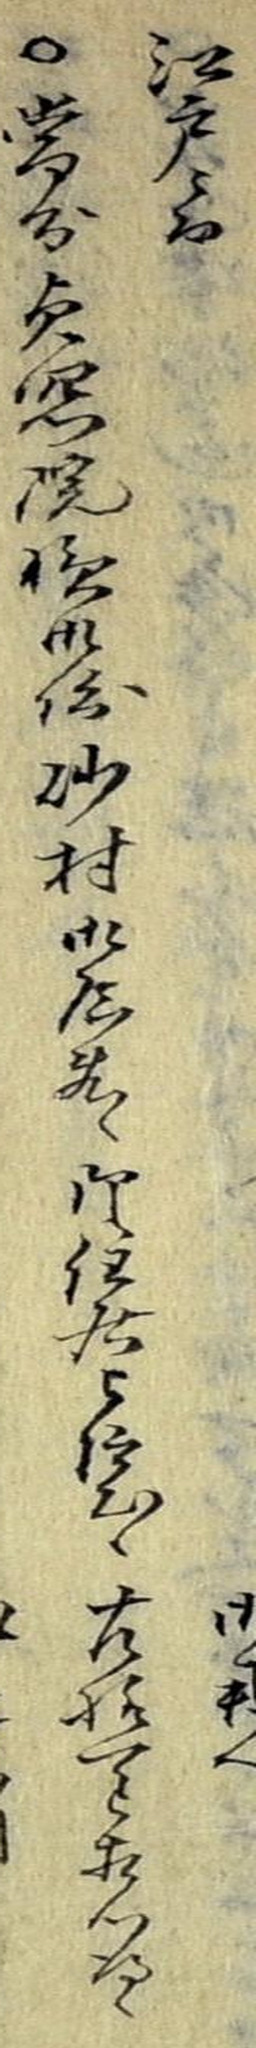○当分貞照院様御儀砂村御屋敷へ御住居被仰出候左様可被相心得候
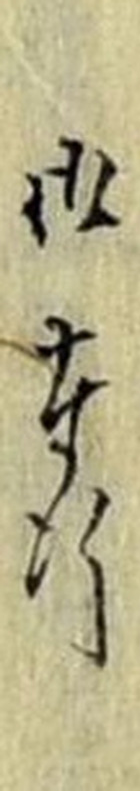御奉行
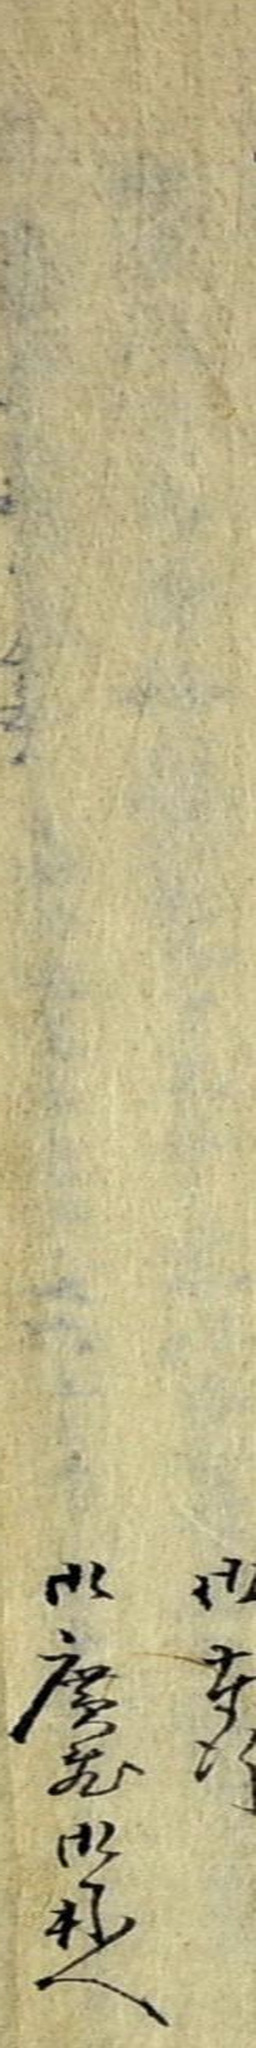御広敷御用人
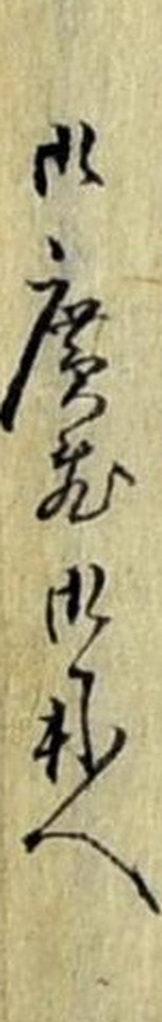御広敷御用人
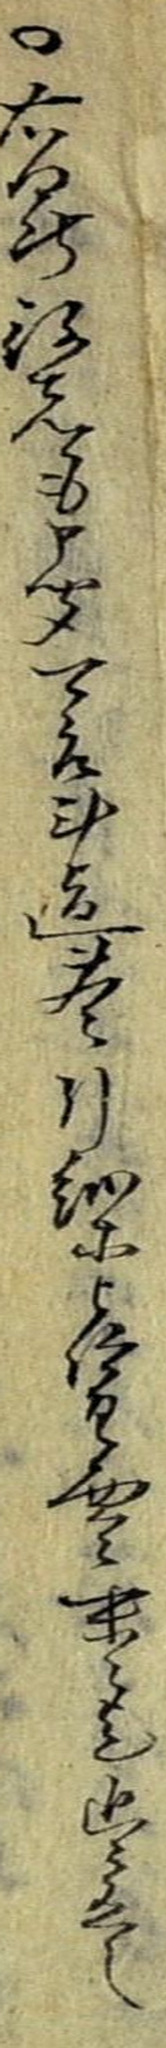○右同断役先へも申聞可取斗旨」夫々引越等被仰付候面々末々迄追々有之
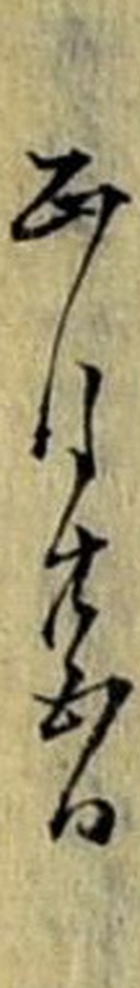正月廿五日

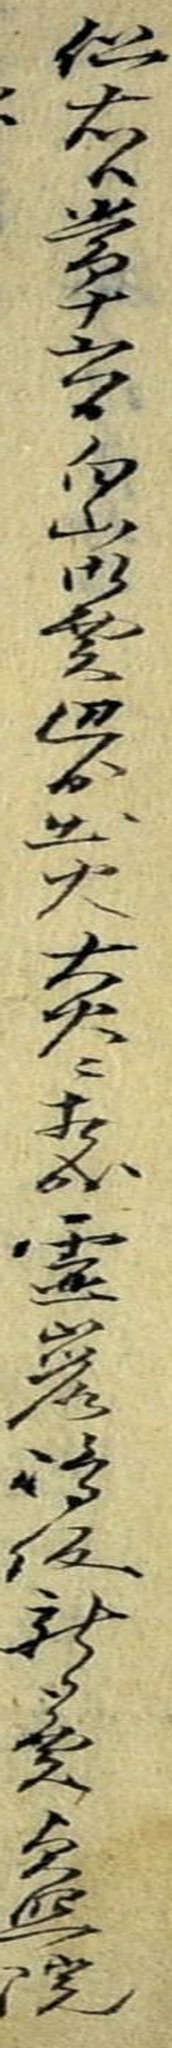但右は当十六日白山御殿辺ゟ出火大火に相成霊厳嶋仮新御殿貞照院
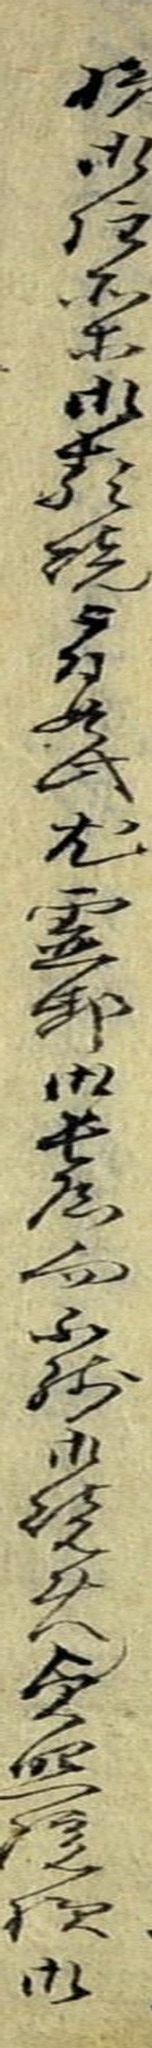様御住所等御類焼に付如此尤霊邸御長屋不残御焼失貞照院様御
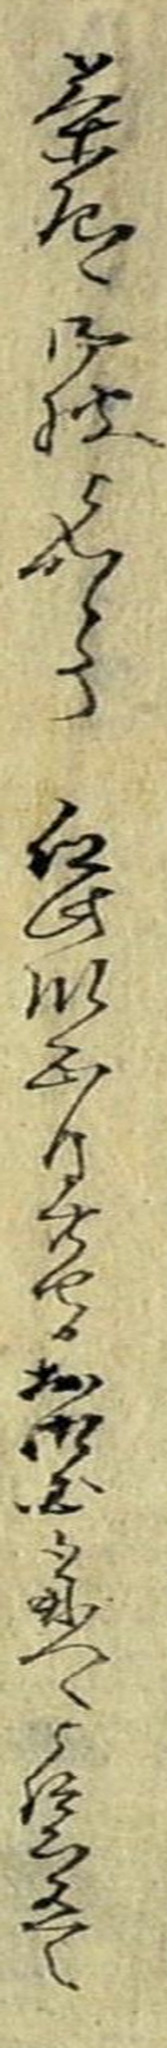茶屋へ御被成候事但此段正月廿四日於御国御用人へ被仰出有之
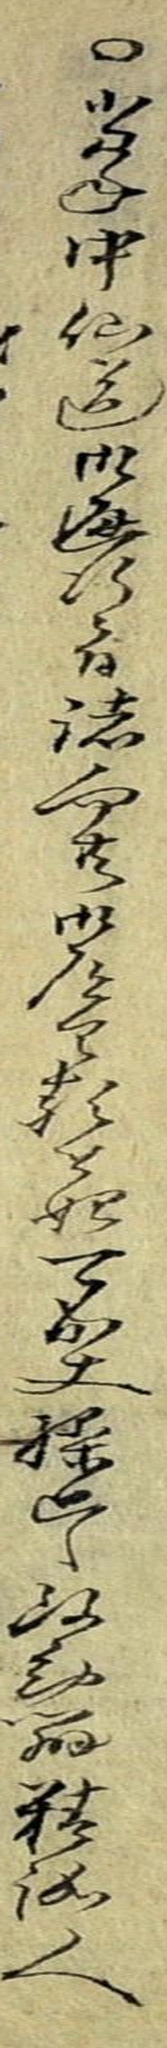○当年中仙道御通行に付諸向共御道具類を始可成丈繰廻し致勘弁精誠人
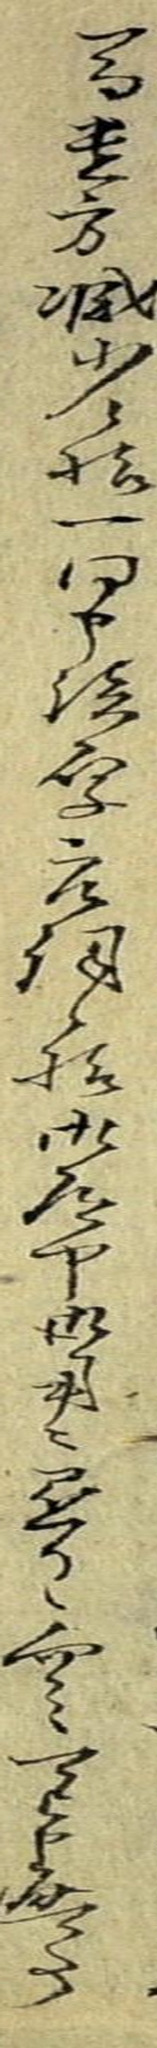馬遣方減少候様一同申渡厚取調候様御道中御用に懸り候向々へ可被申通候事
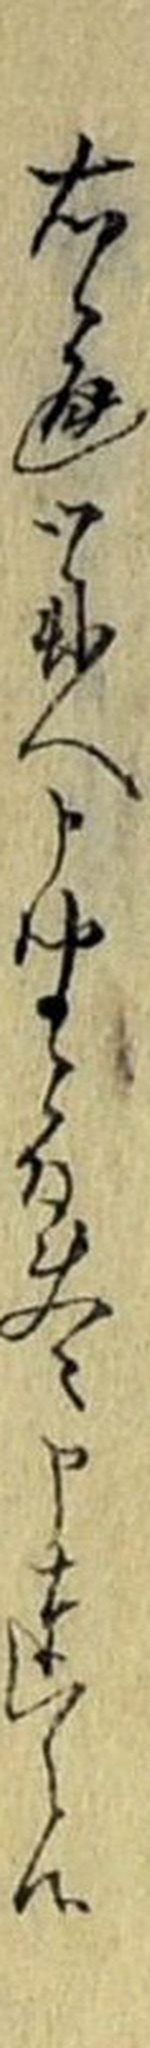右之通御用人申聞候に付夫々申達之候
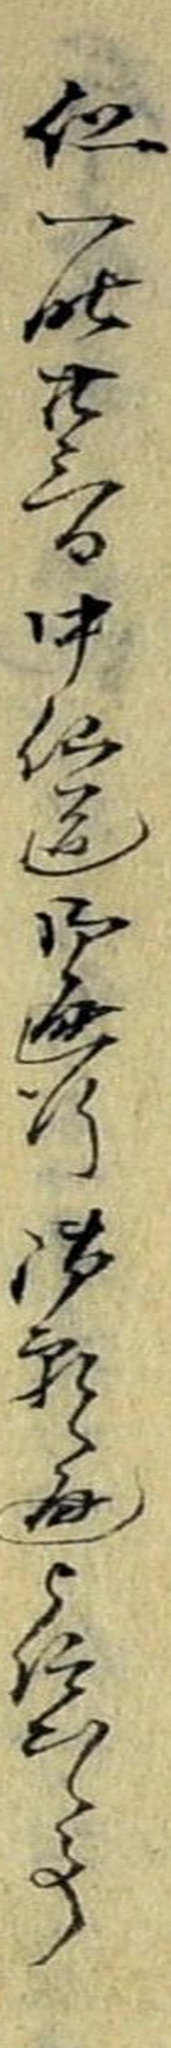但一昨廿三日中仙道御通行御願之通被仰出候事
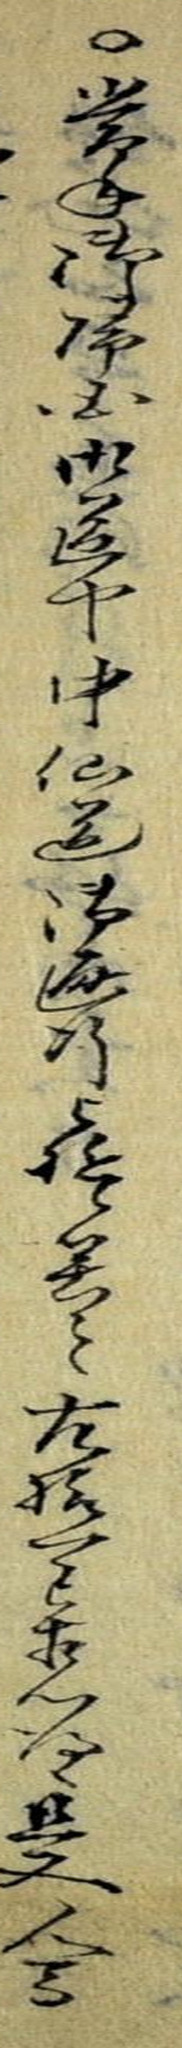○当年御帰国御道中中仙道御通行被遊候筈に候左様可被相心得候且又人馬
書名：命令之部 六
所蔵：福井県文書館 Fukui Prefectural Archives
